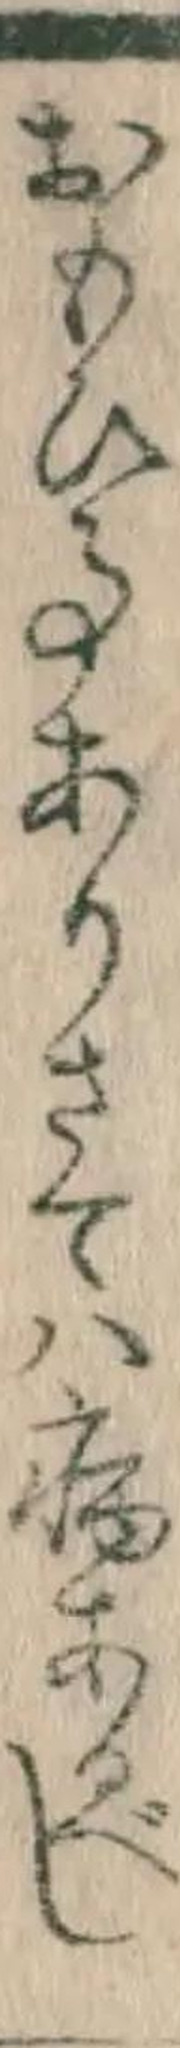おもひ事ありさては病あるべし
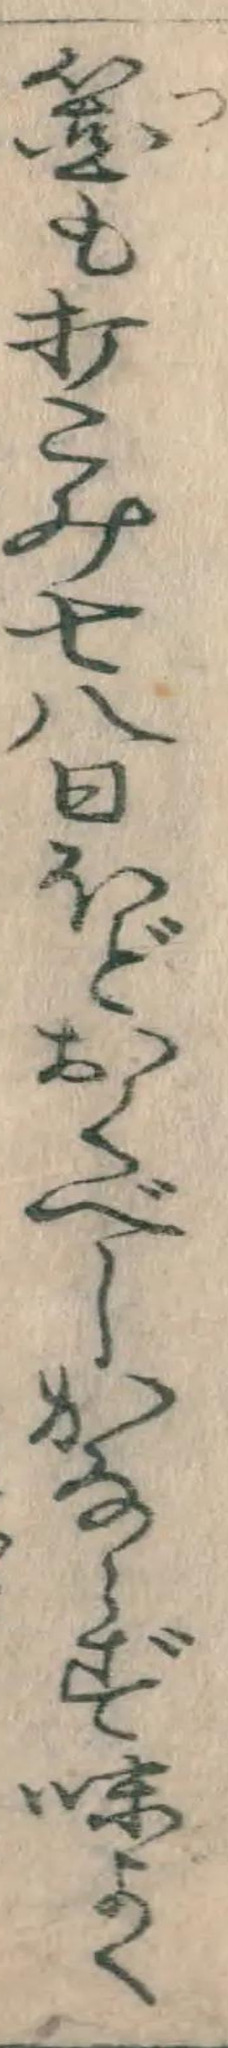箇も打こみ七八日ほどおくべしかならず味よく
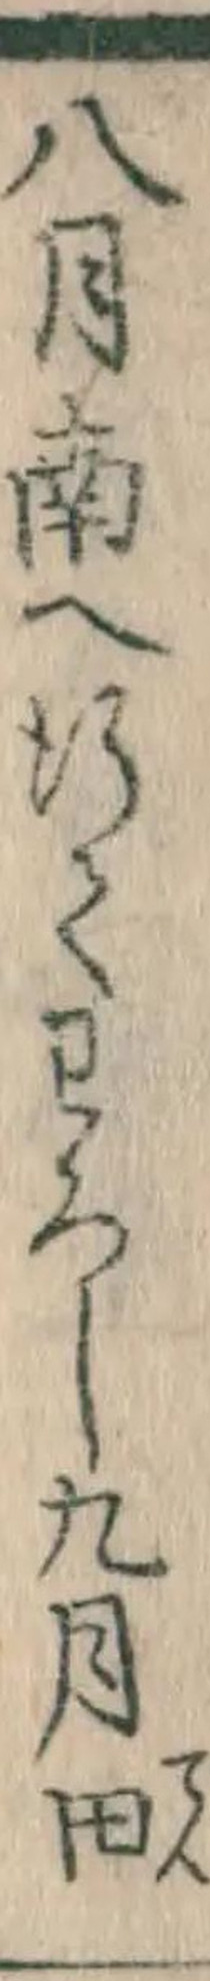八月南へ行てわろし九月田
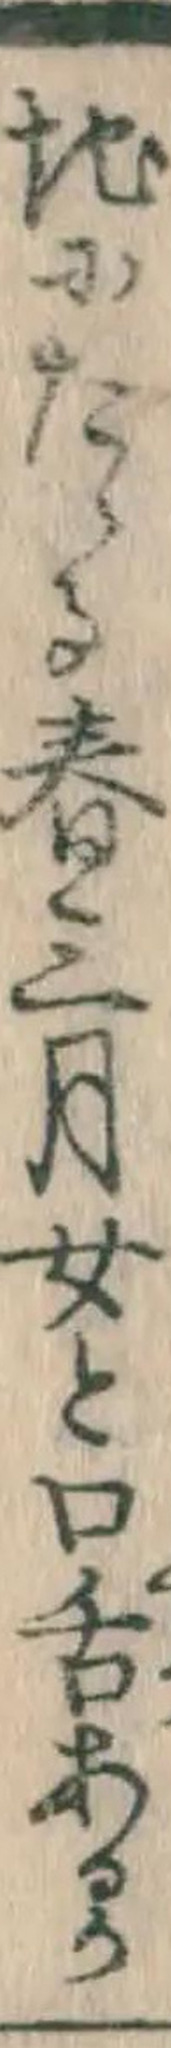地にたゝる春三月女と口舌あるか
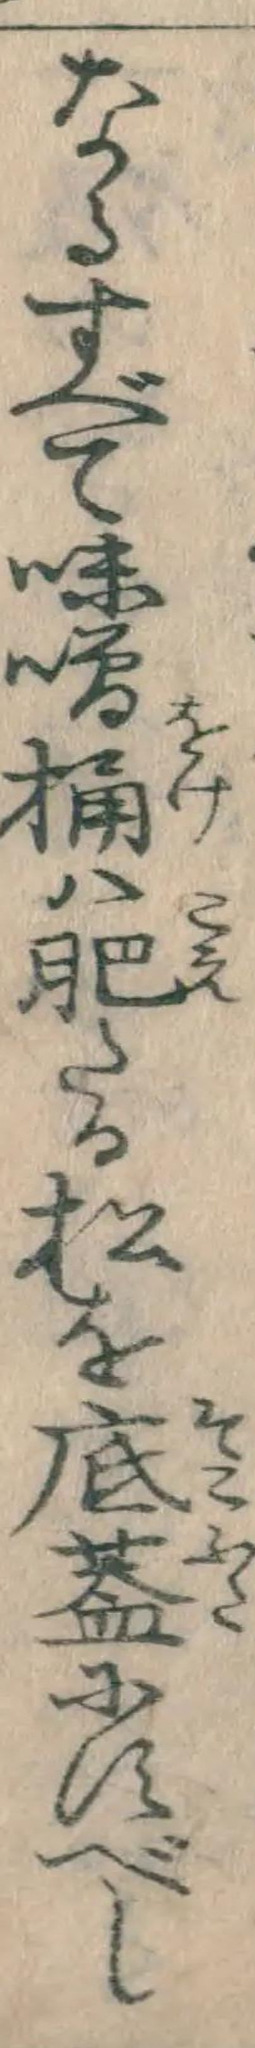なるすべて味噌桶は肥たる松を底葢にすべし
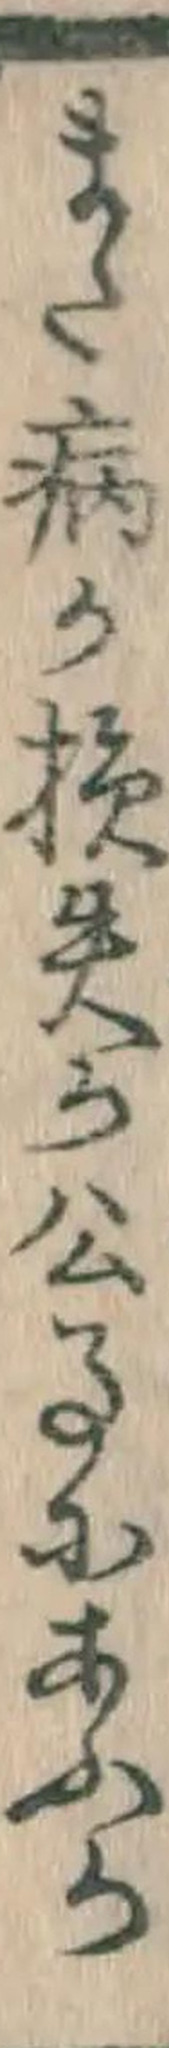また病か損失か公事にあふか
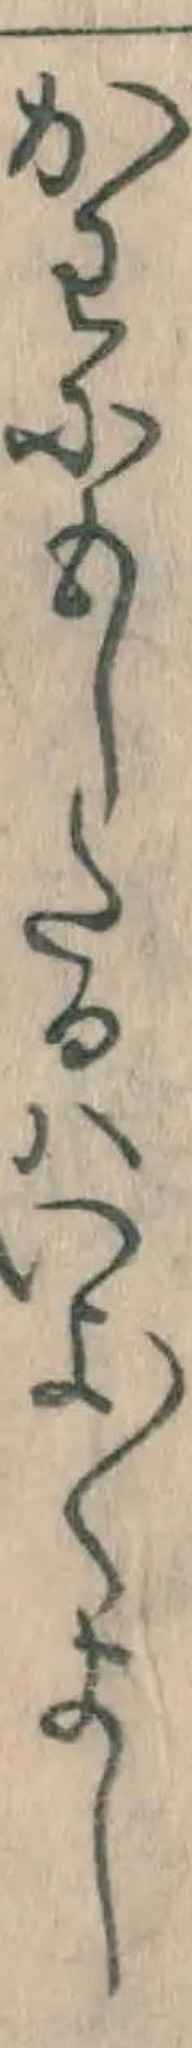がわにもしたるはいよ〳〵よし

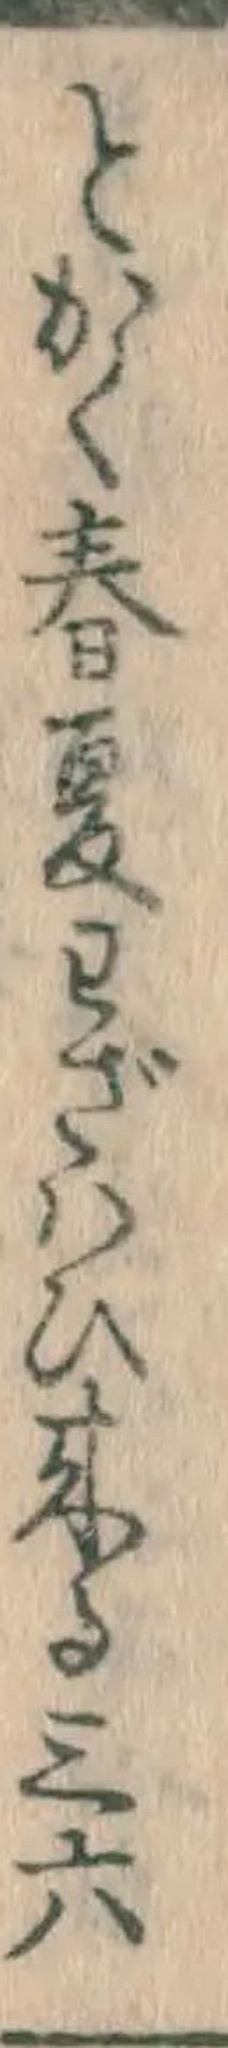とかく春夏わざはひ来る三六
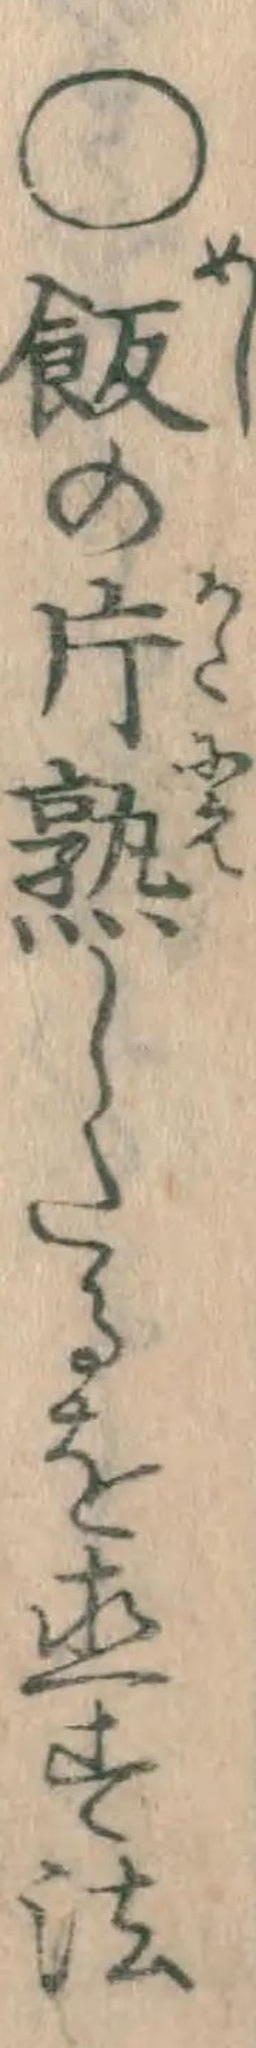○飯の片熟したるを直す法
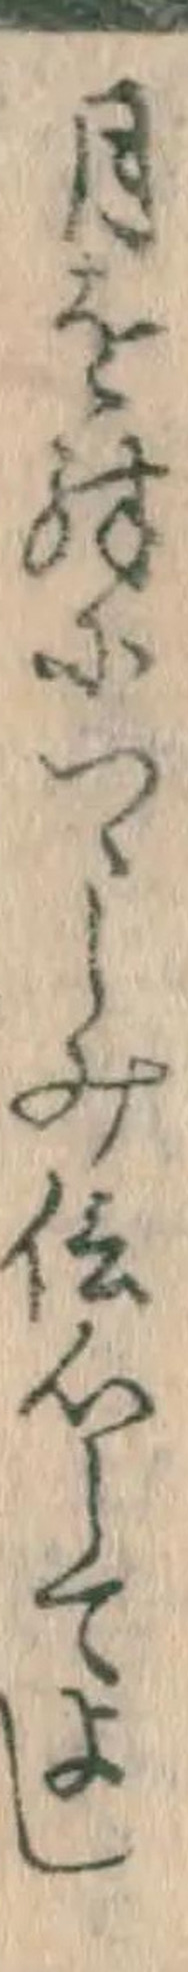月を殊につゝしみ信心してよし
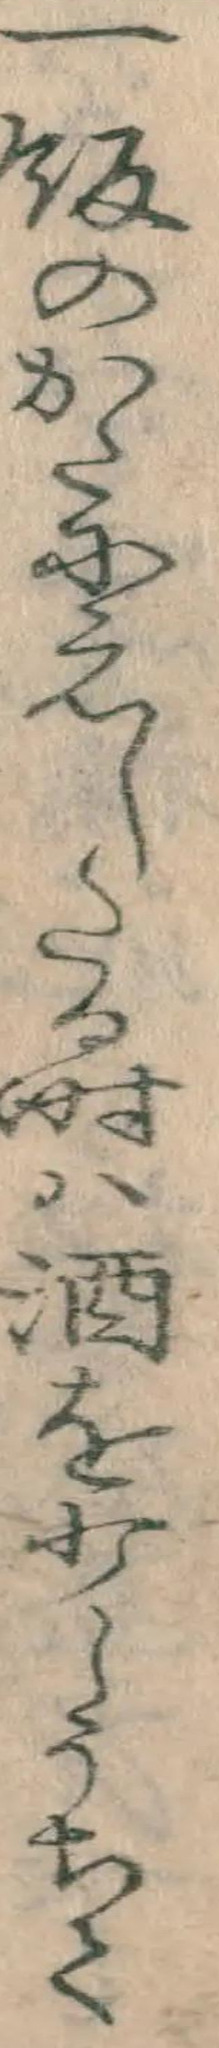一飯のかたにえしたる時は酒を少しうちて
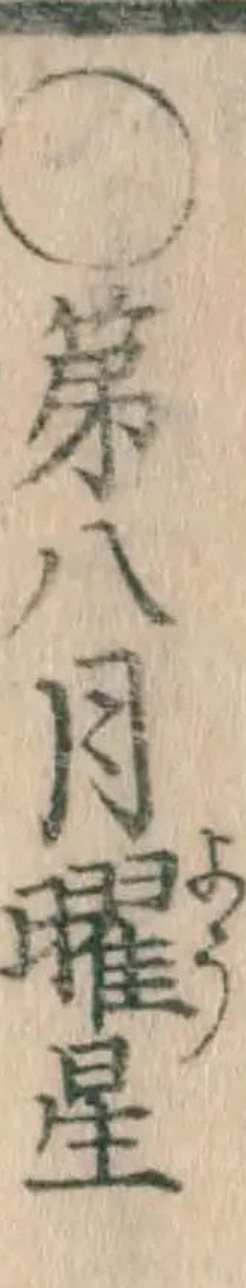○第八月曜星
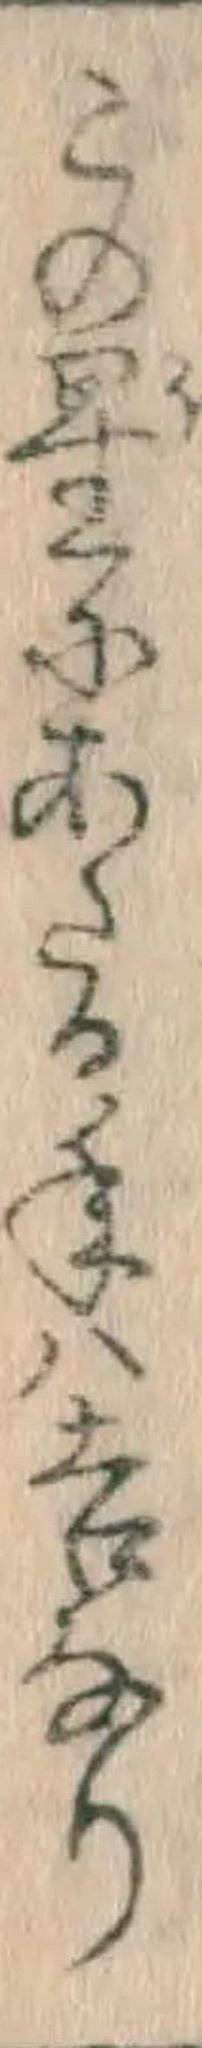この星にあたる年は吉なり
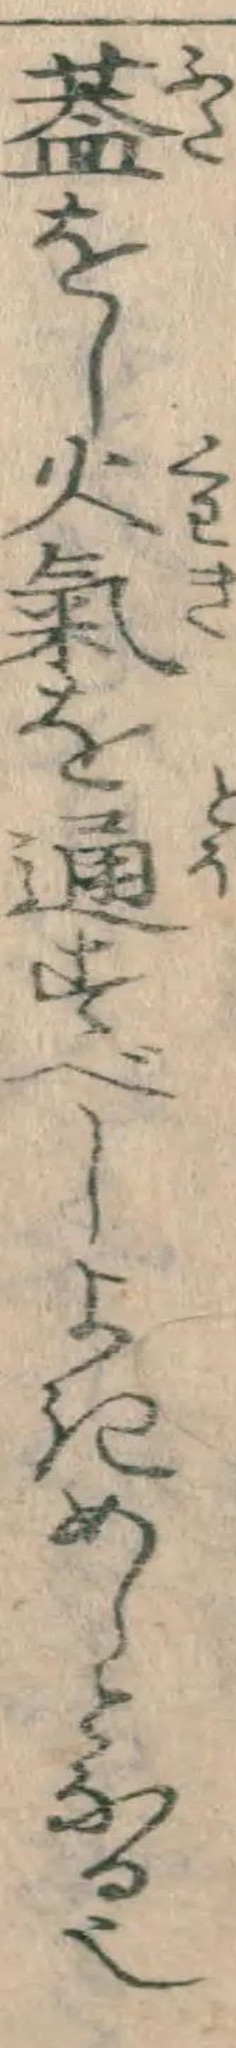葢をし火気を通すべしよきめしとなる也
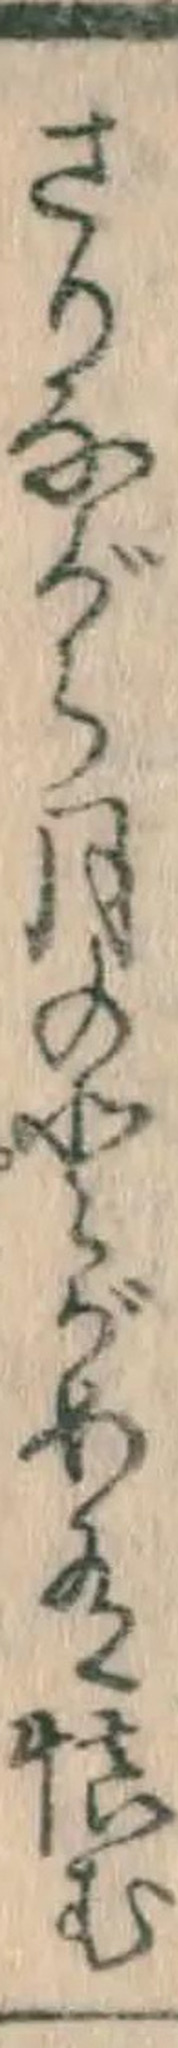さりながら月のとがめ有慎む
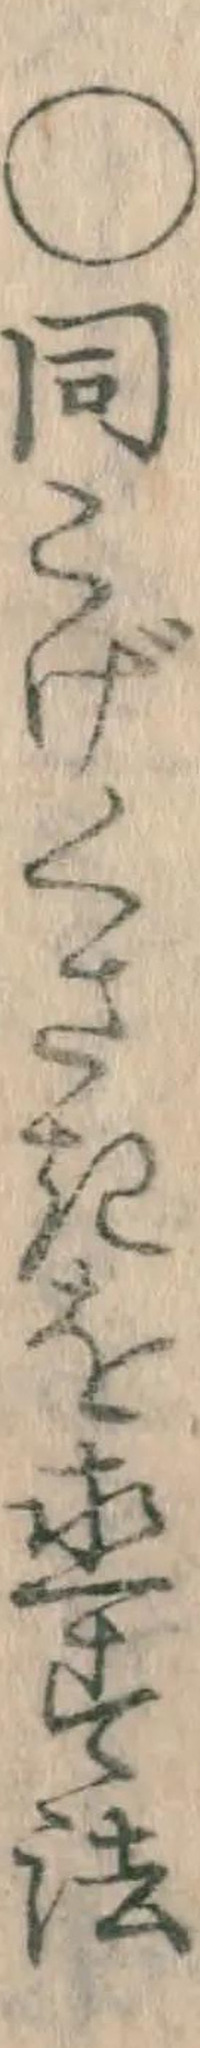○同こげくさきを直す法
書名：広益秘事大全 3巻. [1]
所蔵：国立国会図書館 National Diet Library, JAPAN
